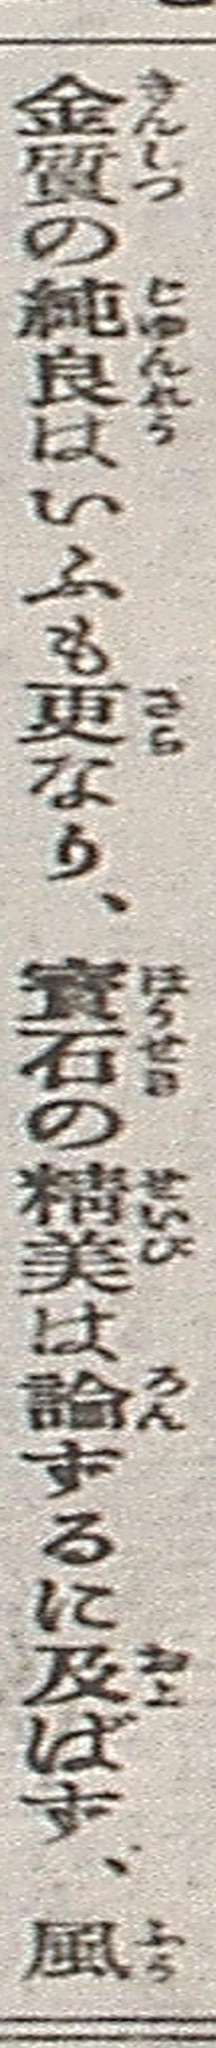金質の純良はいふも更なり、宝石の精美は論ずるに及ばず、風
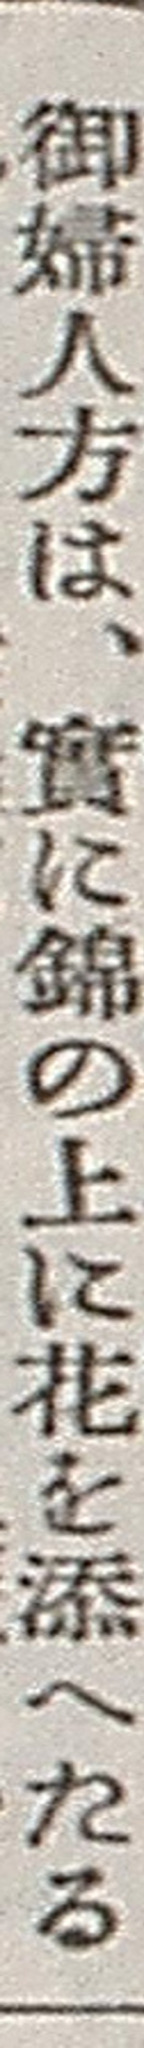御婦人方は、実に錦の上に花を添えたる
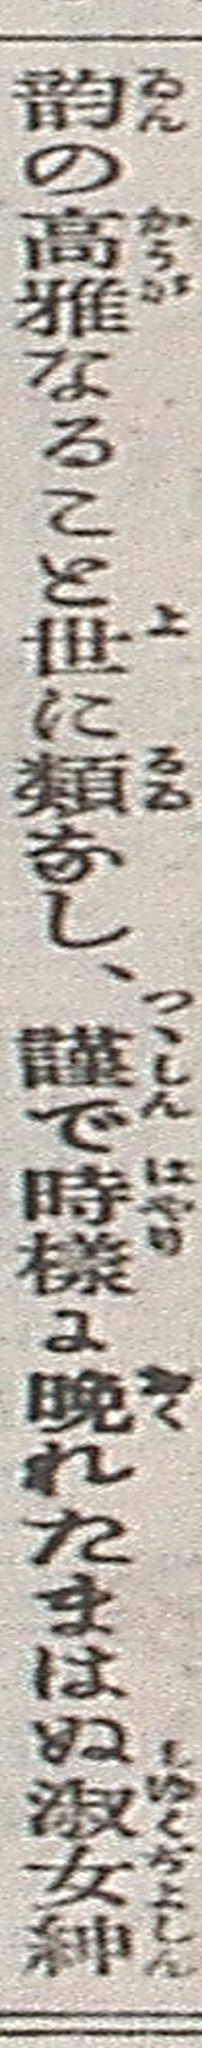韵の高雅なること世に類なし、謹で時様に晩れたまはぬ淑女紳
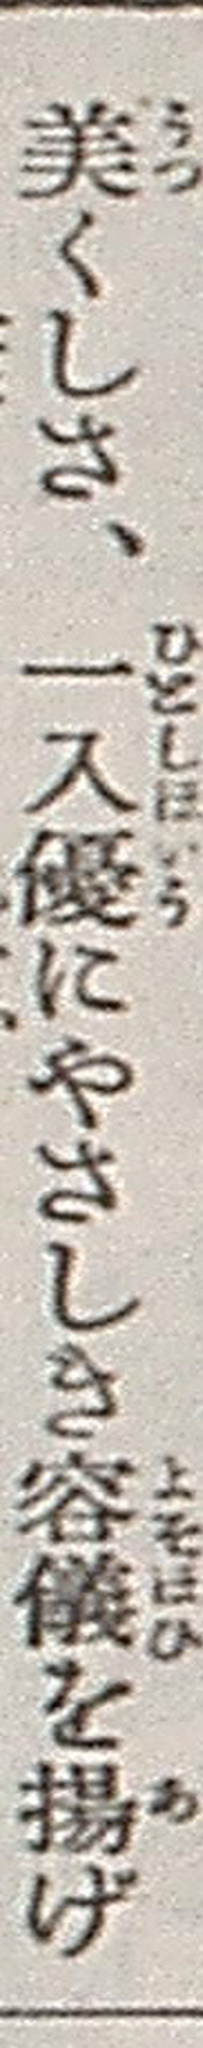美くしさ、一入優にやさしき容儀を揚げ
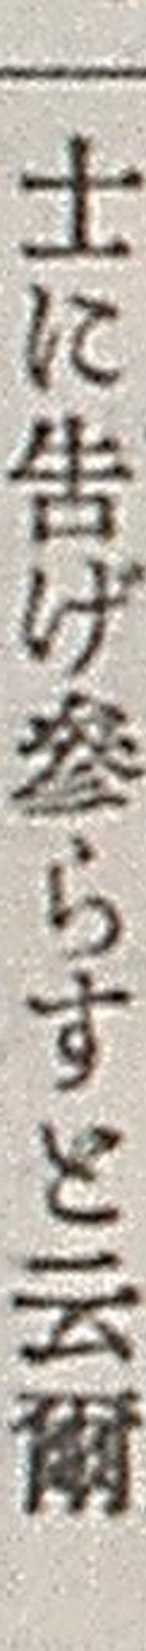士に告げ参らすと云爾
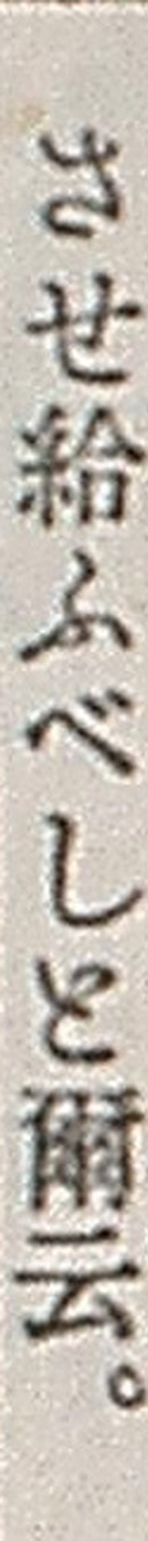させ給ふべしと爾云。
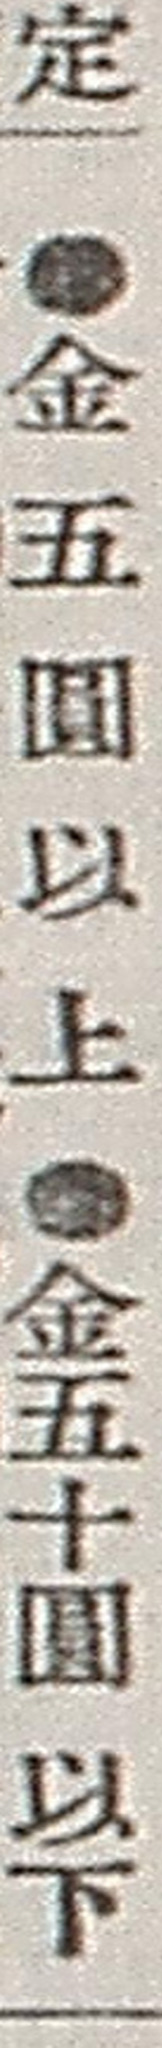定●金五円以上●金五十円以下
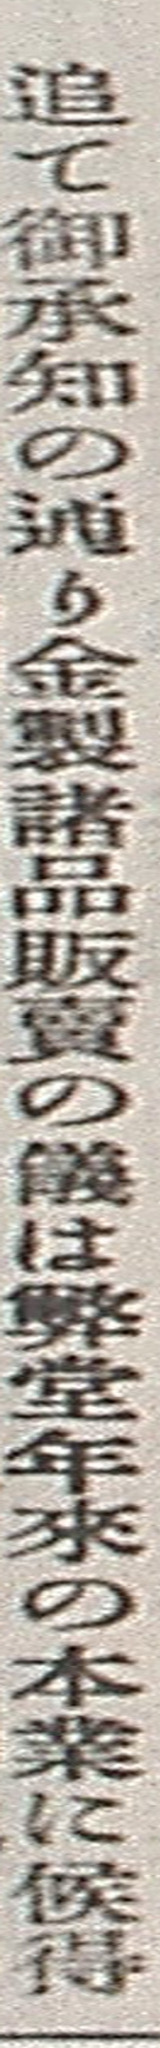追て御承知の通り金製諸品販売の儀は弊堂年来の本業に候得
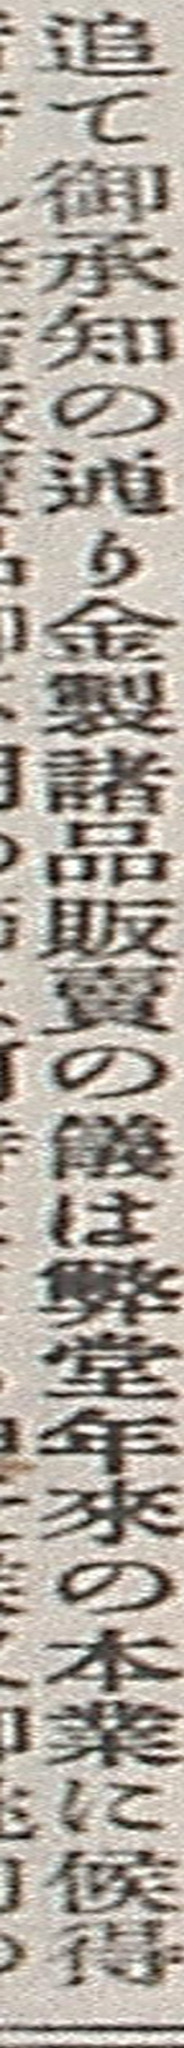追て御承知の通り金製諸品販売の儀は弊堂年来の本業に候得
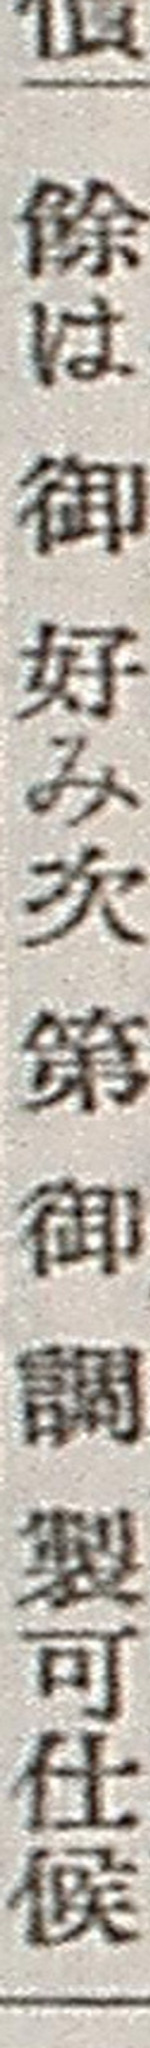価余は御好み次第御調製可仕候
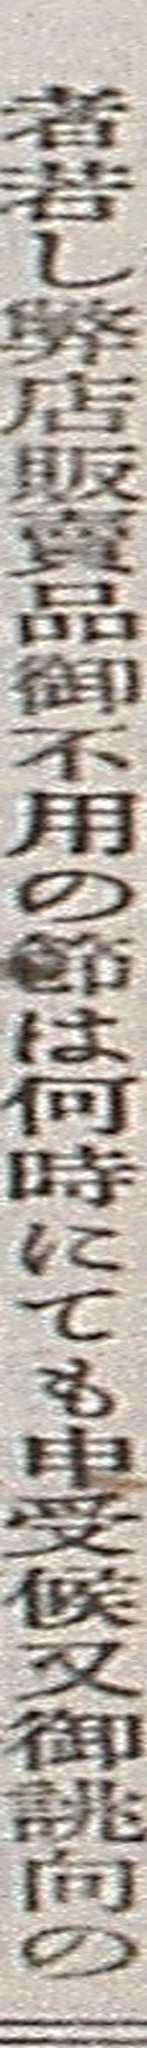者若し弊店販売品御不用の節は何時にても申受候又御誂向の
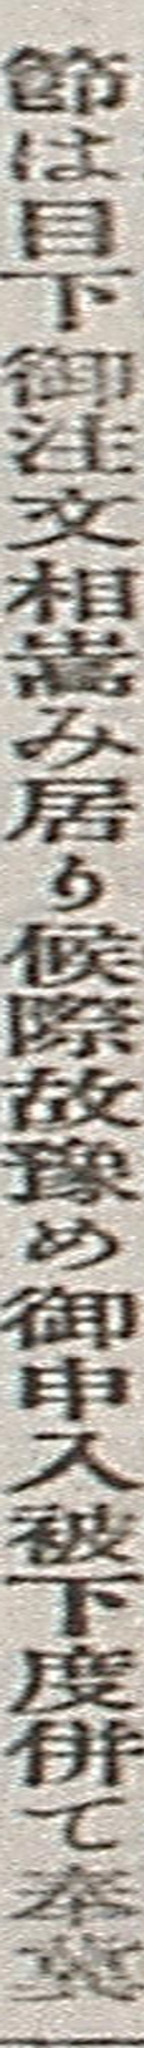節は目下御注文相嵩み居り候際故豫め御申入被下度併て奉冀
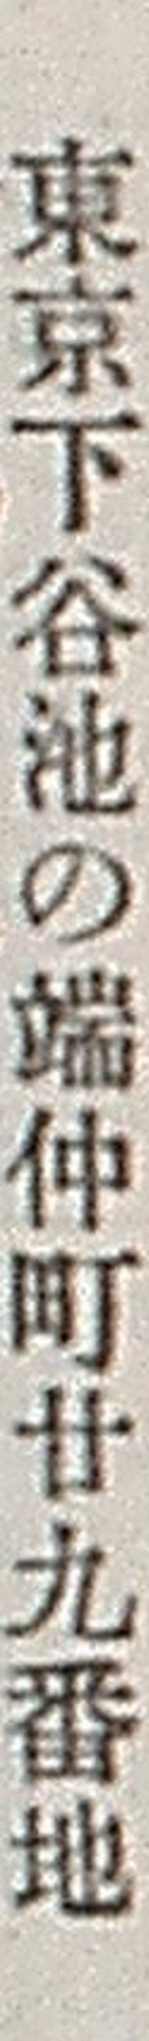東京下谷池の端仲町廿九番地
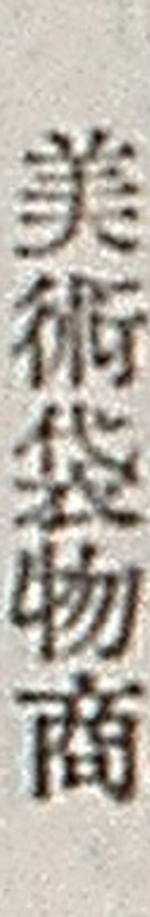美術袋物商
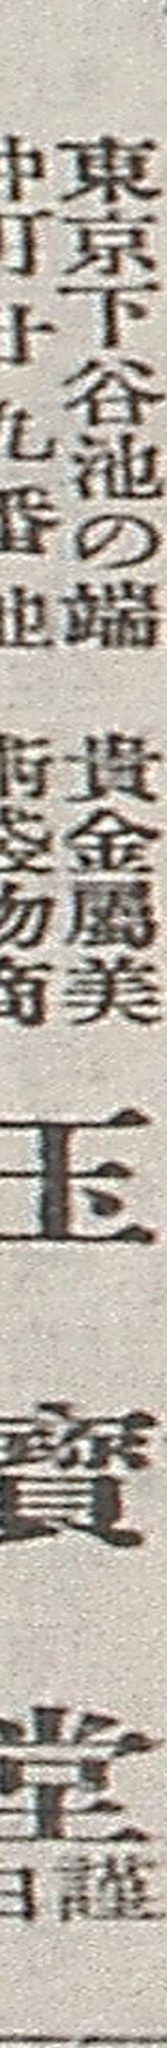東京下谷池の端貴金属美玉寳堂謹
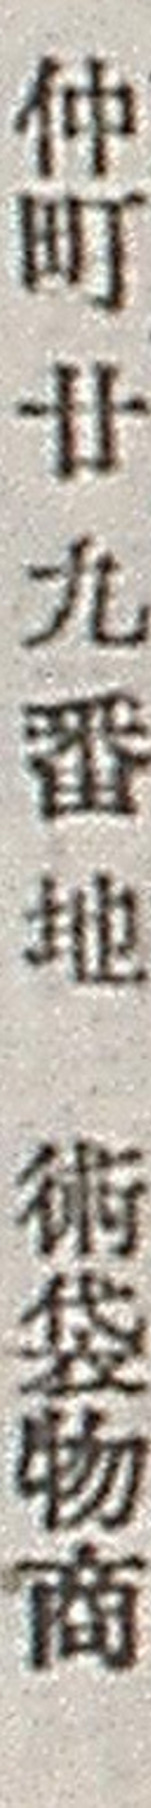仲町廿九番地術袋物商白
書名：風俗畫報臨時増刊第百十九號　大海嘯被害録（中）
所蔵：東京大学地震研究所図書室 Earthquake Research Institute Library, The University of Tokyo, JAPAN
